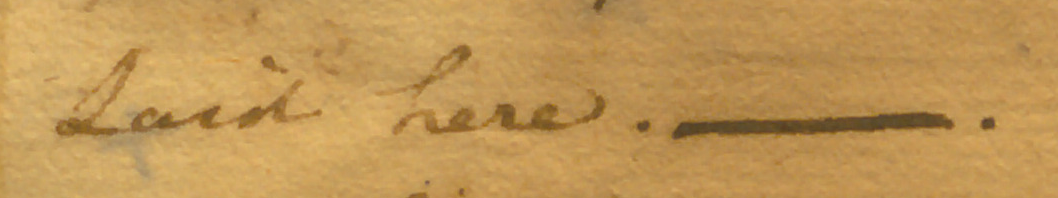Laid here.-.
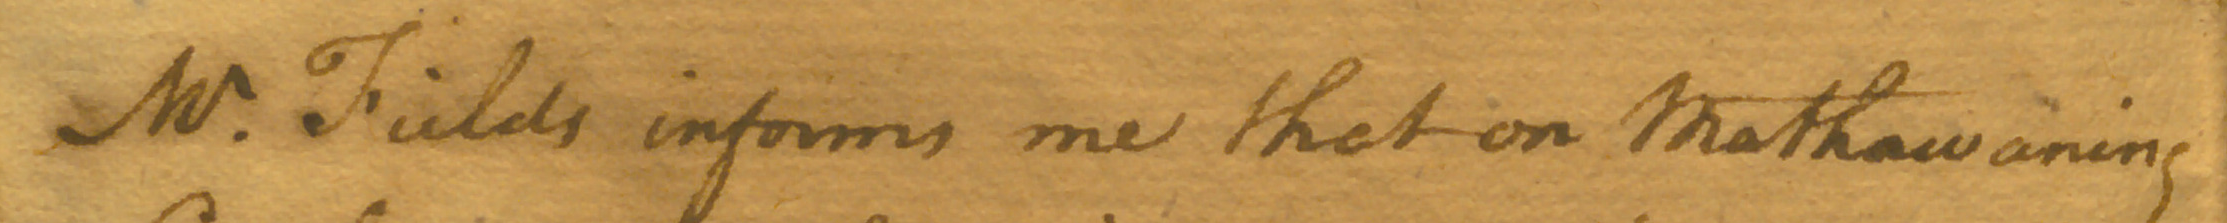M^r. Fields informs me that on Mathawaning
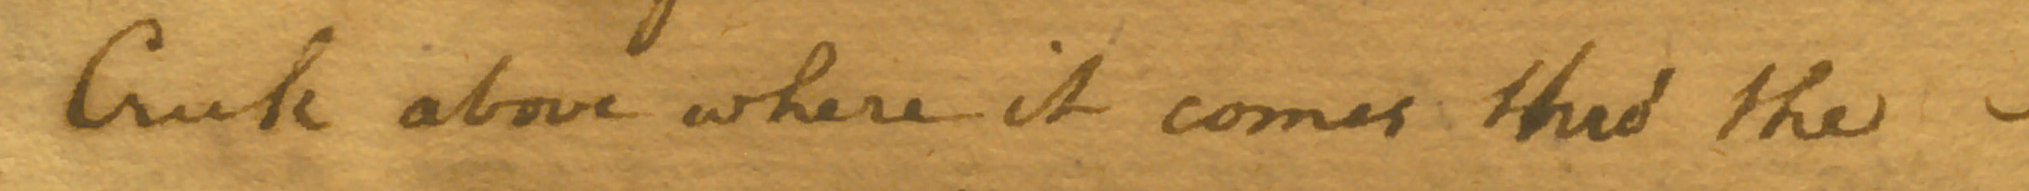Creek above where it comes thro' the
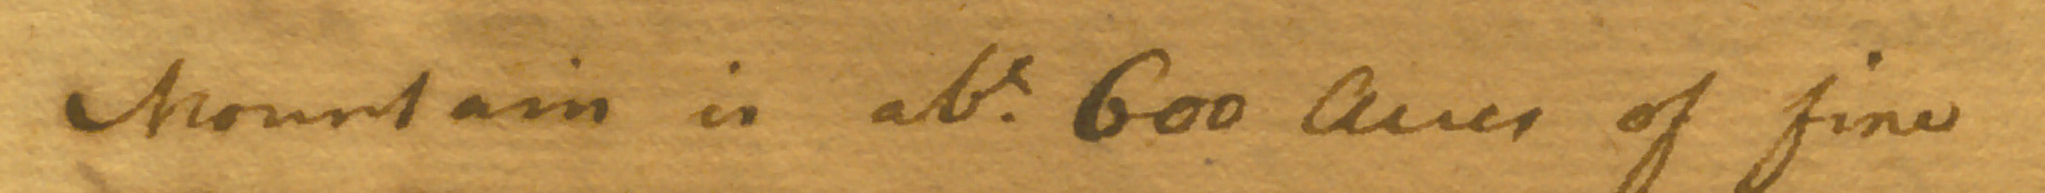Mountain is ab^t. 600 acres of fine
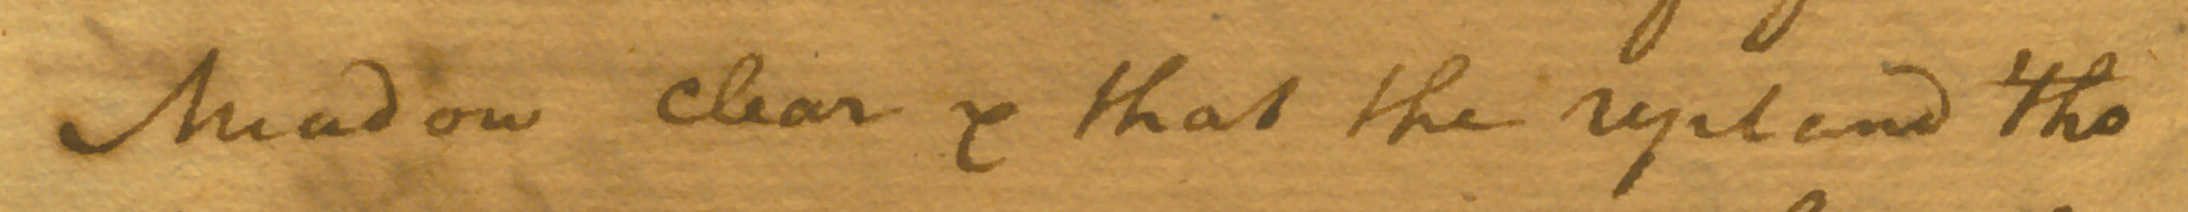Meadow clear & that the upland 'tho
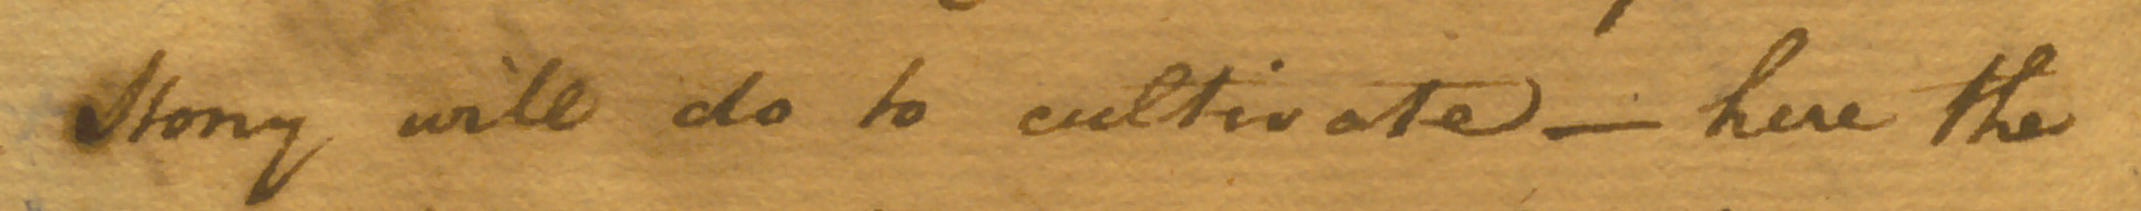stony will do to cultivate- here the
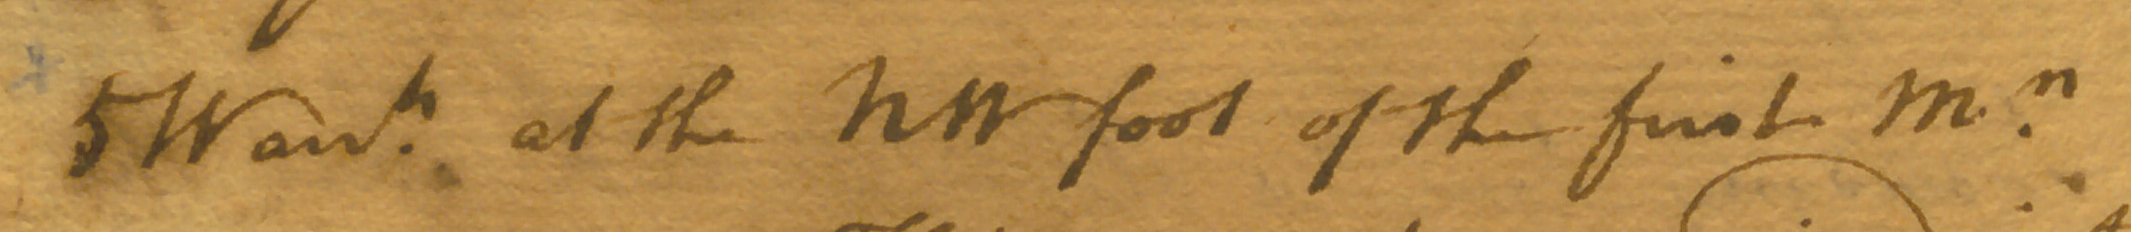5 Warr^t. at the NW foot of the first M^n.
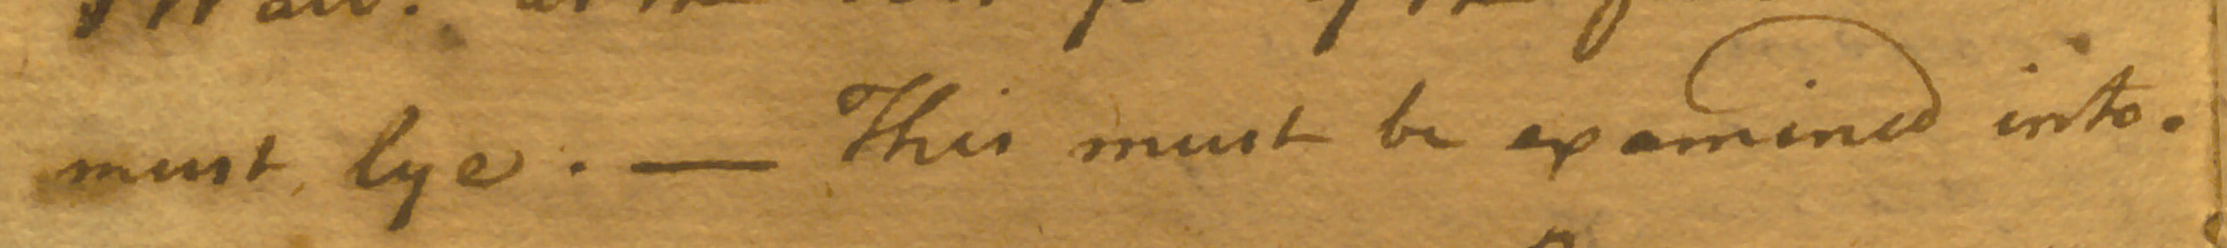must lye.- This must be examined into.
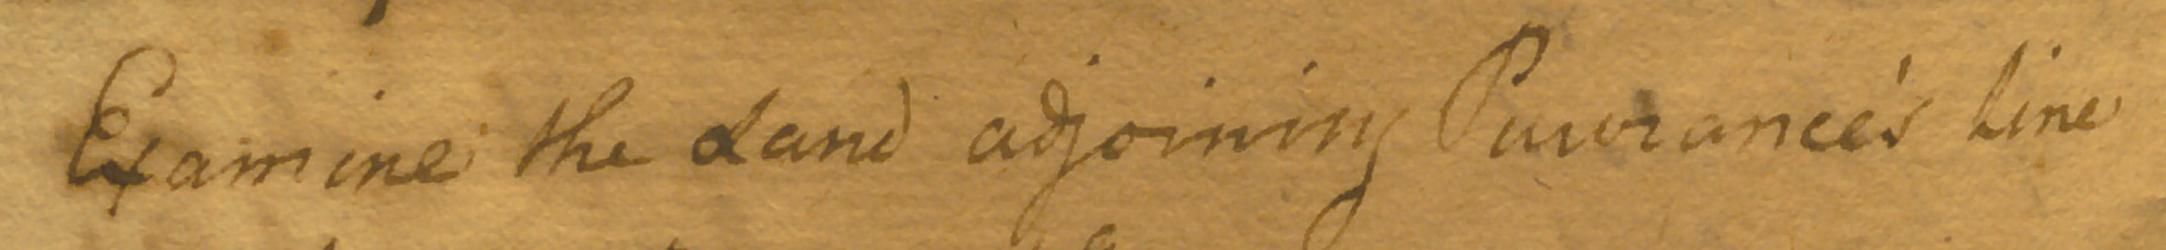Examine the Land adjoining Puvirance's Line
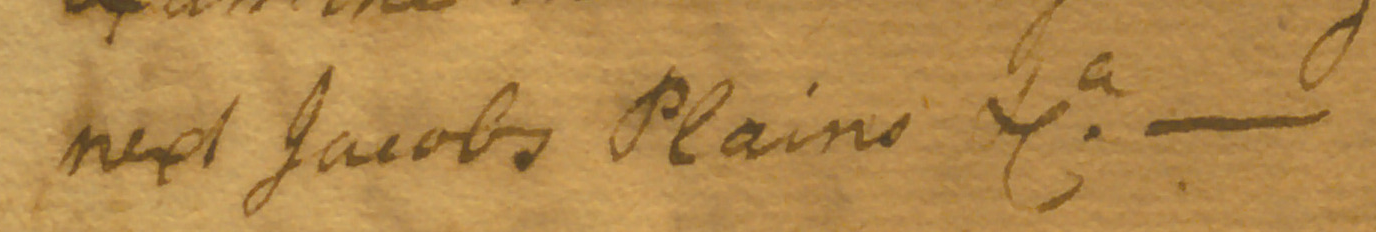next Jacobs Plains &c^a.-
